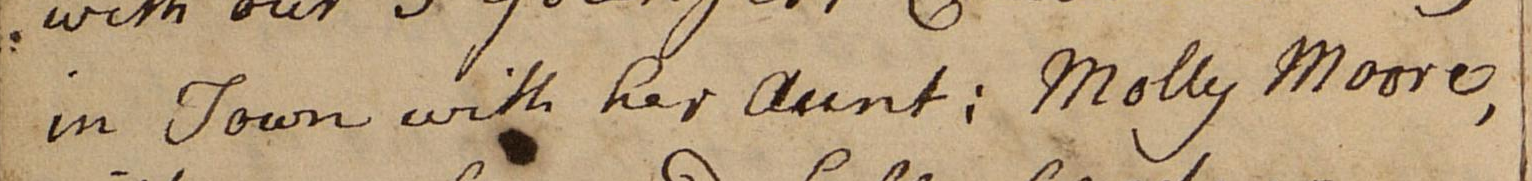in Town with her Aunt; Molly Moore,
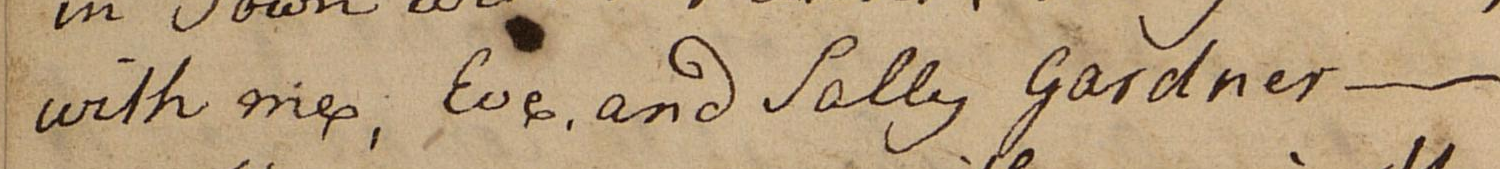with me, Eve and Sally Gardner-
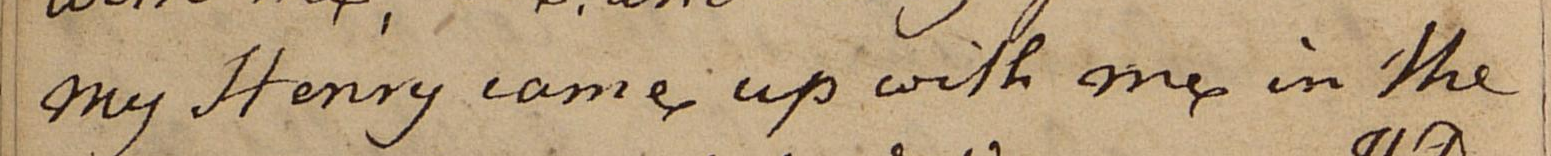My Henry came up with me in the
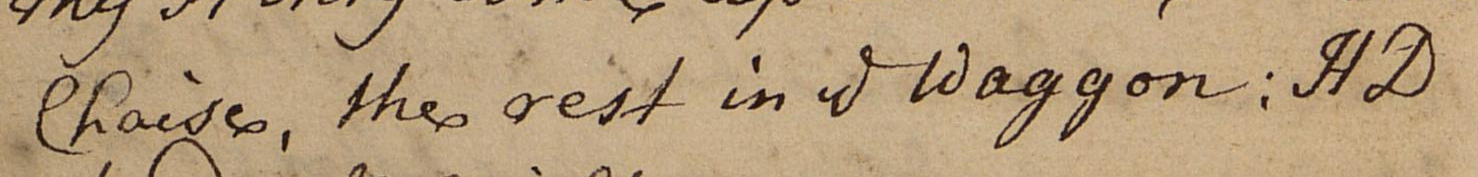Chaise, the rest in y^e Waggon; H D
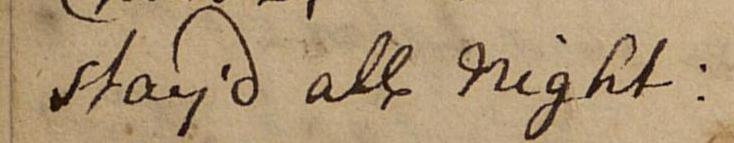stay'd all Night:
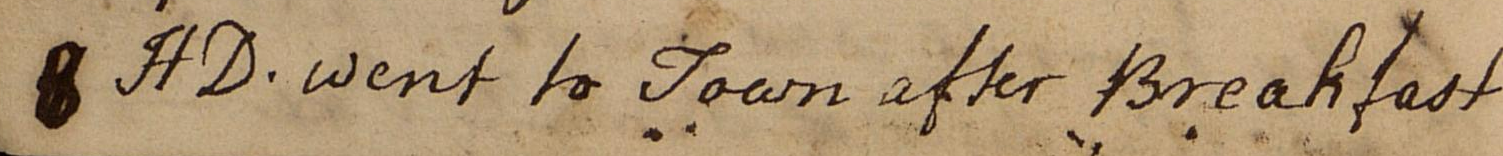8 HD. went to Town after Breakfast
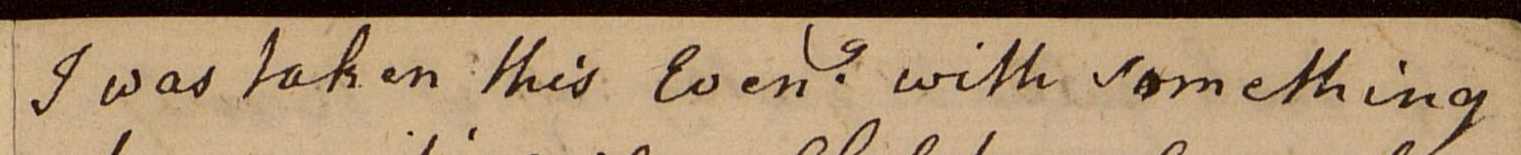I was taken this Even^g. with something
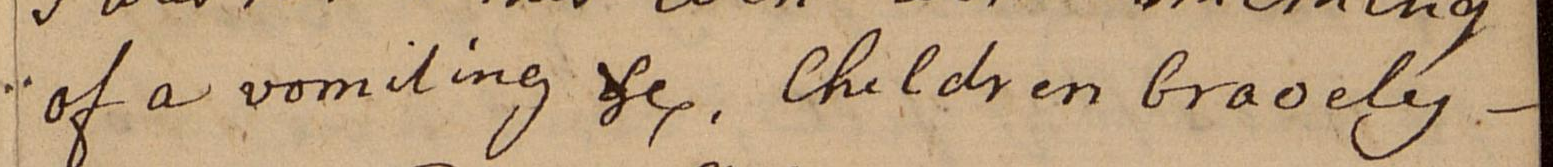of a vomiting &c, Children bravely-
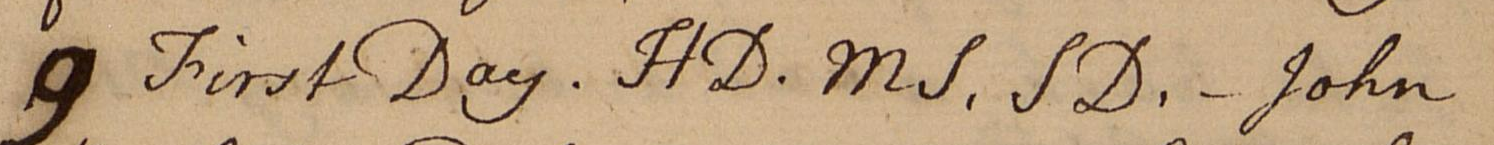9 First Day. HD. MS. SD.- John
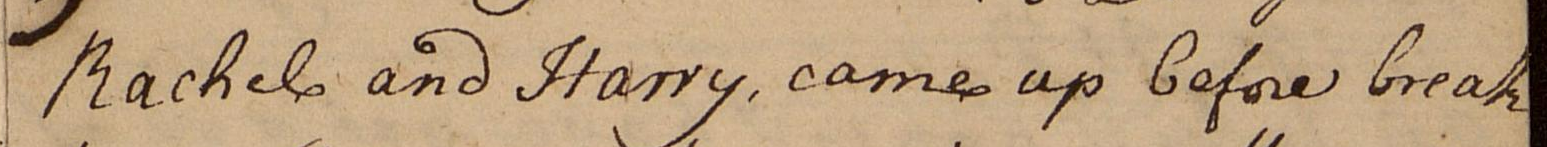Rachel and Harry, came up before break
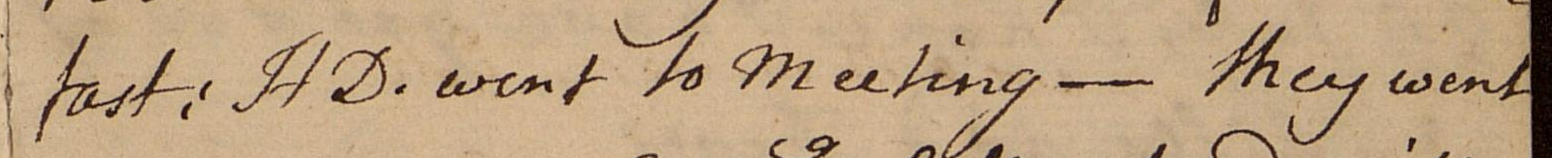fast: HD. went to meeting- they went
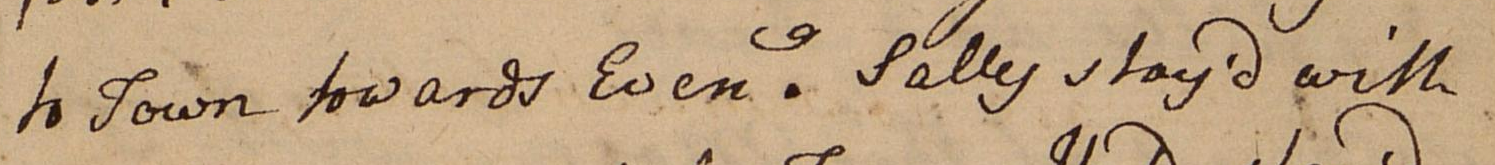to Town towards Even^g. Sally stay'd with
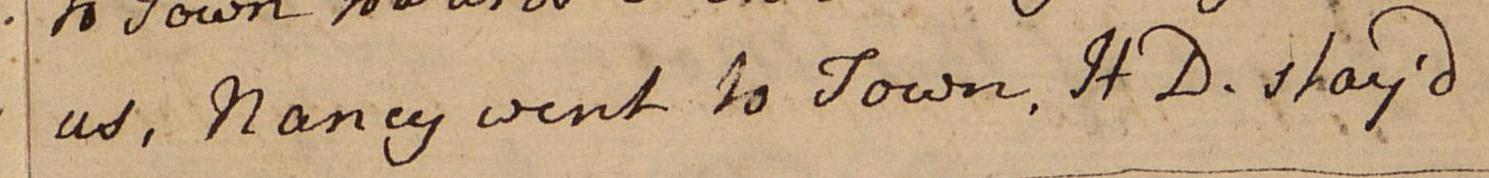us, Nancy went to Town, H D. stay'd
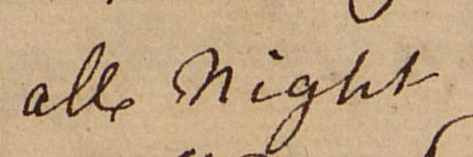all Night
